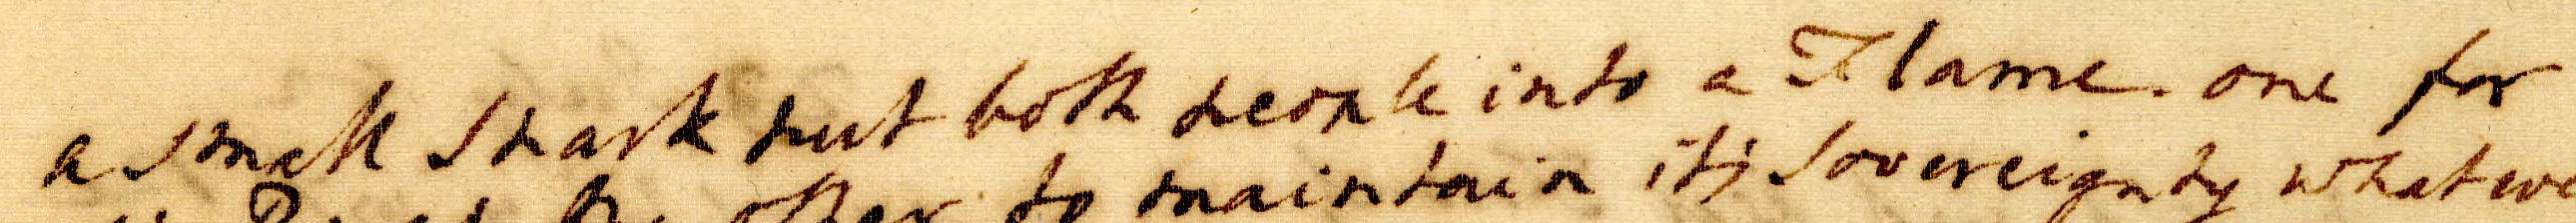a struck shark put both people into a Flame. one for
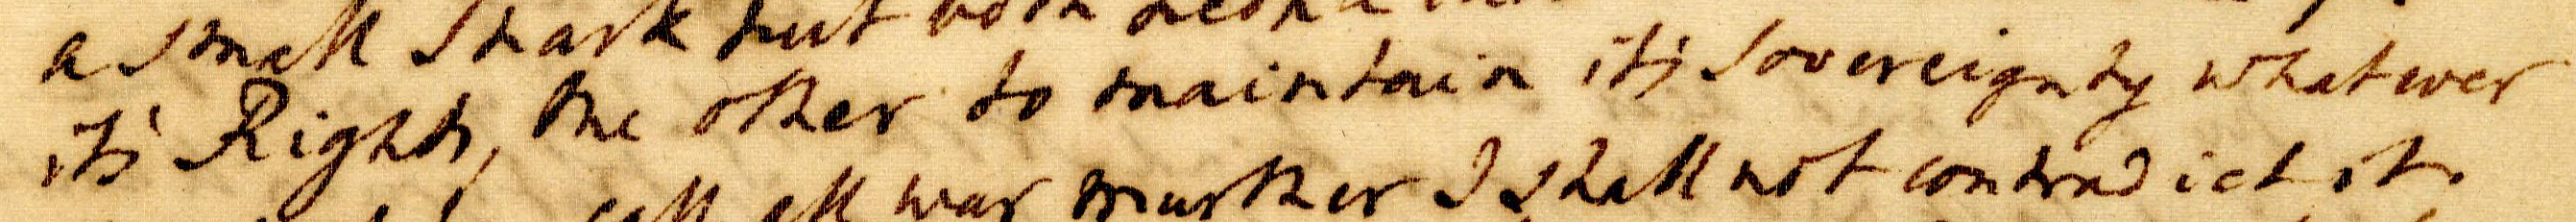its' Rights, the other to maintain its' sovereignty what ever
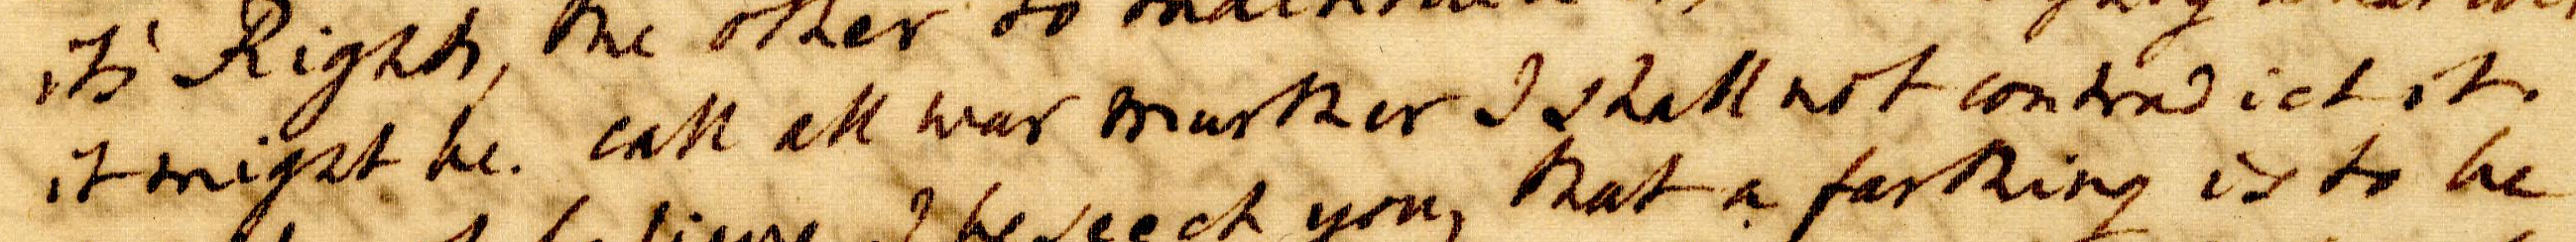it might be. call all war murder I shall not contradict it.
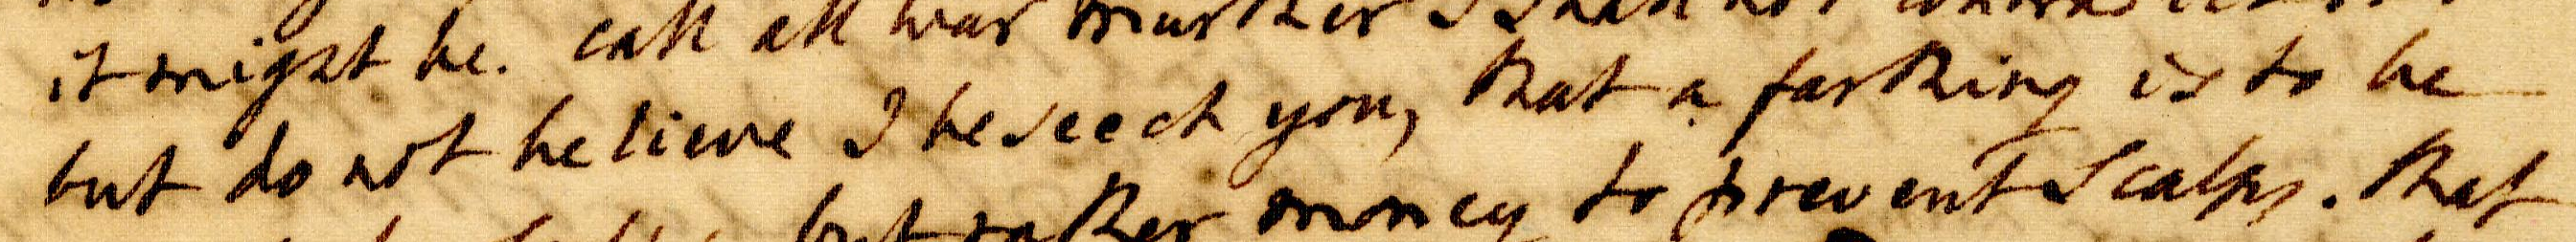but do not believe I beseech you, that a farthing is to be
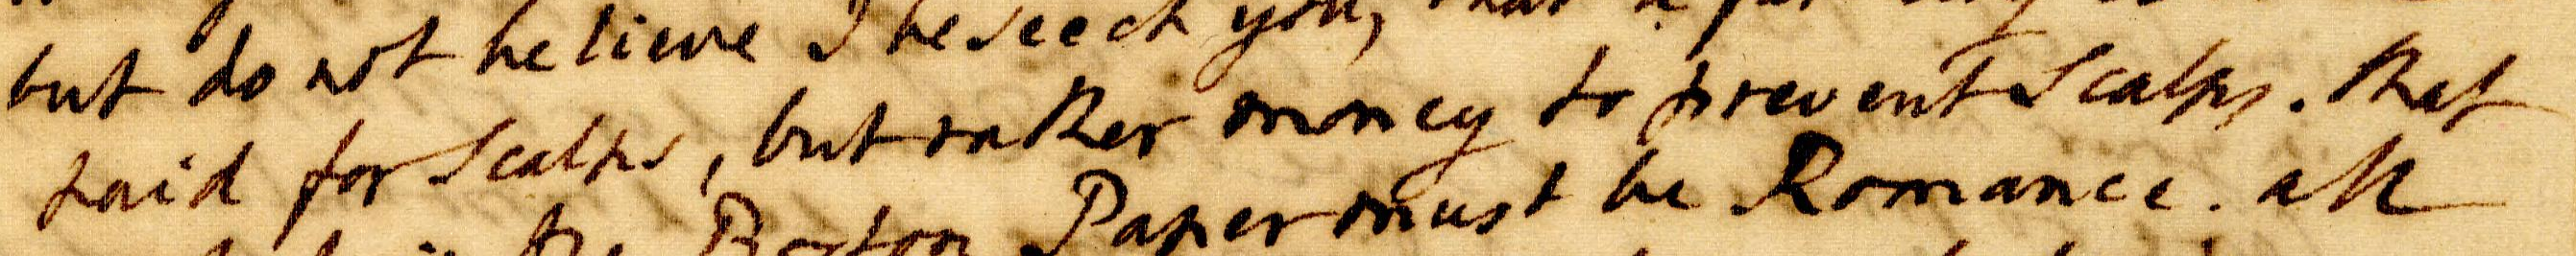paid for scalps, but rather money to prevent Scalps. that
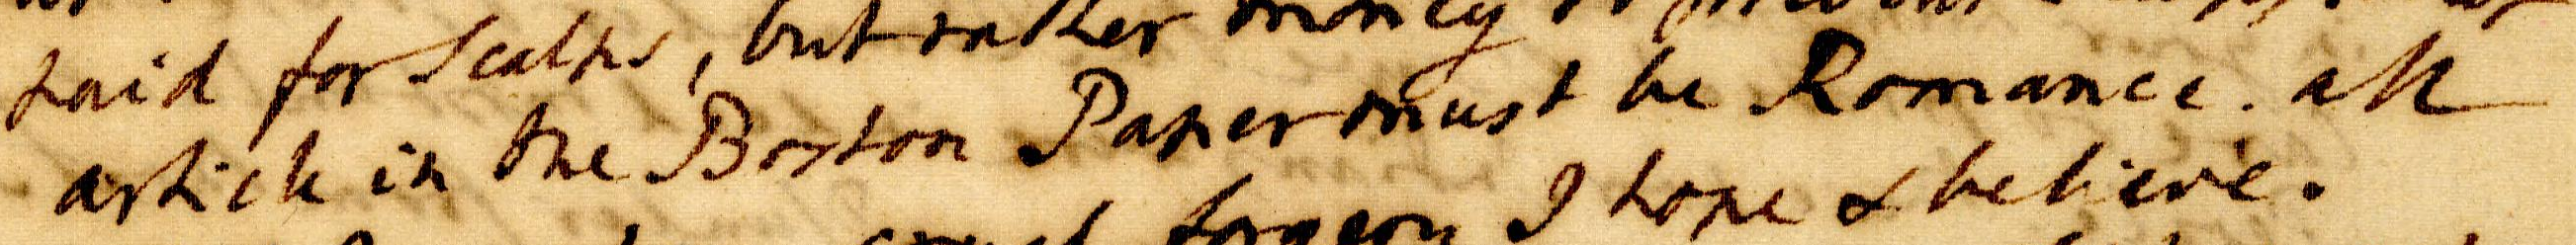article in the Boston Paper must be Romance. all
